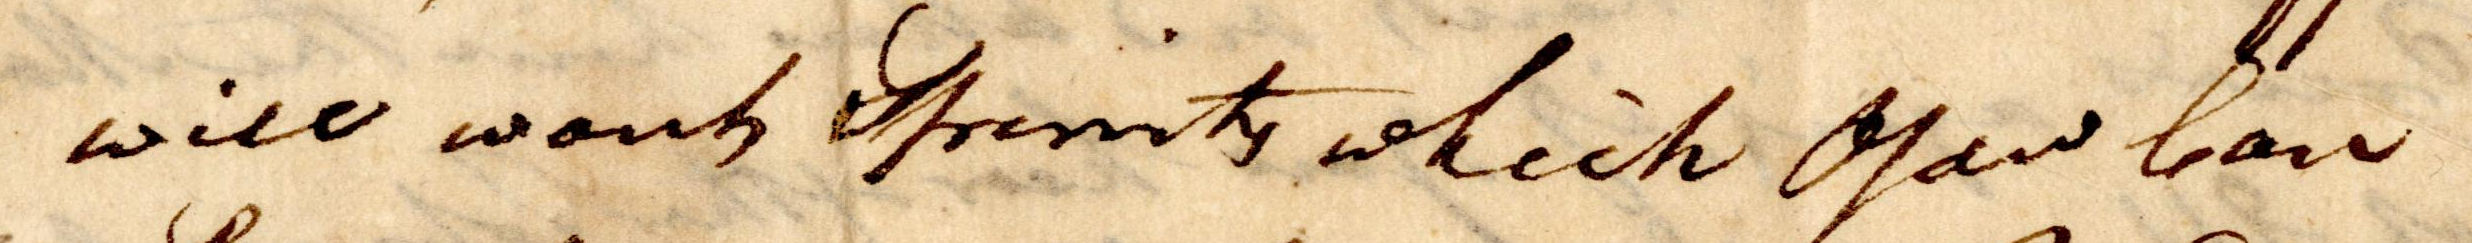will want Spirrits which you can
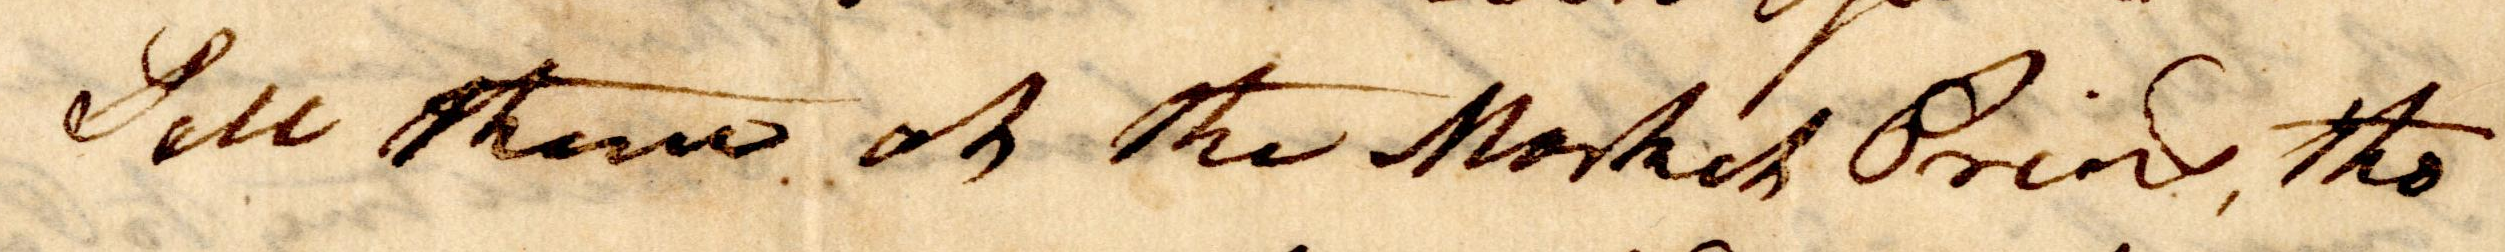sell them at the Market Price, tho
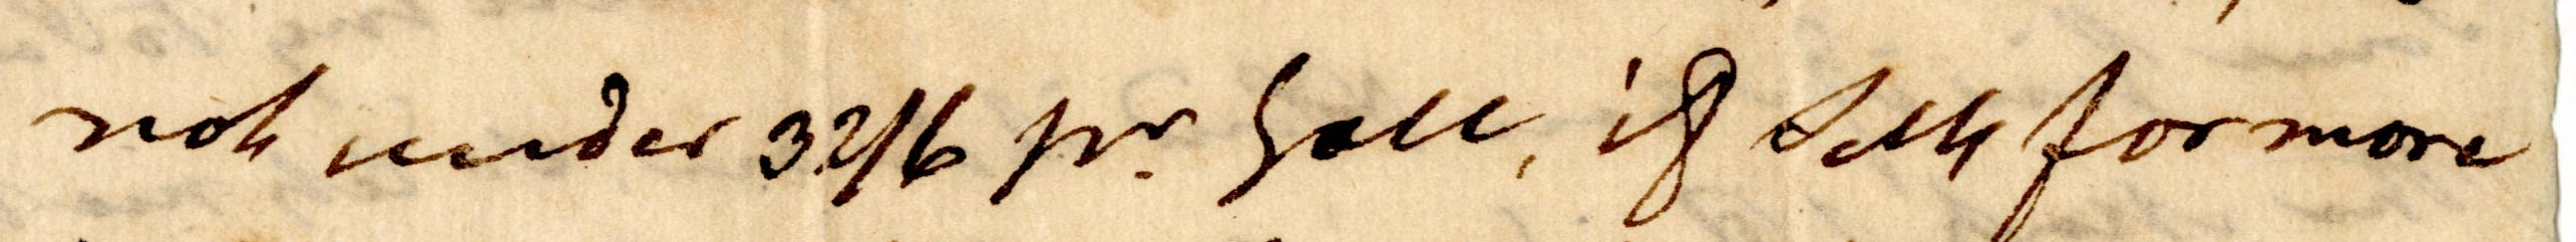not under 32s6 p^r Gall, if Sells for more
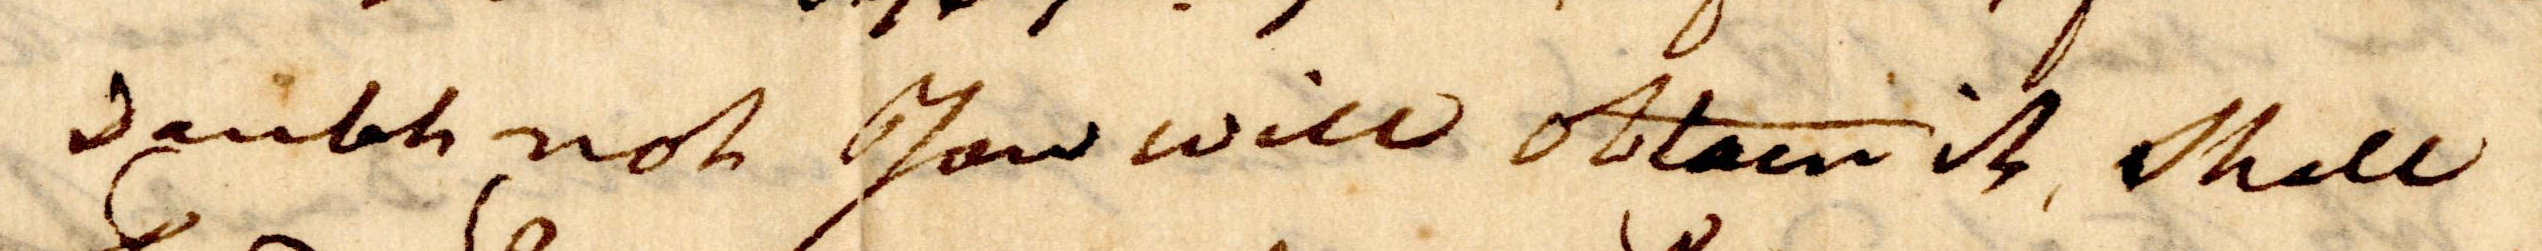doubt not you will obtain it shall
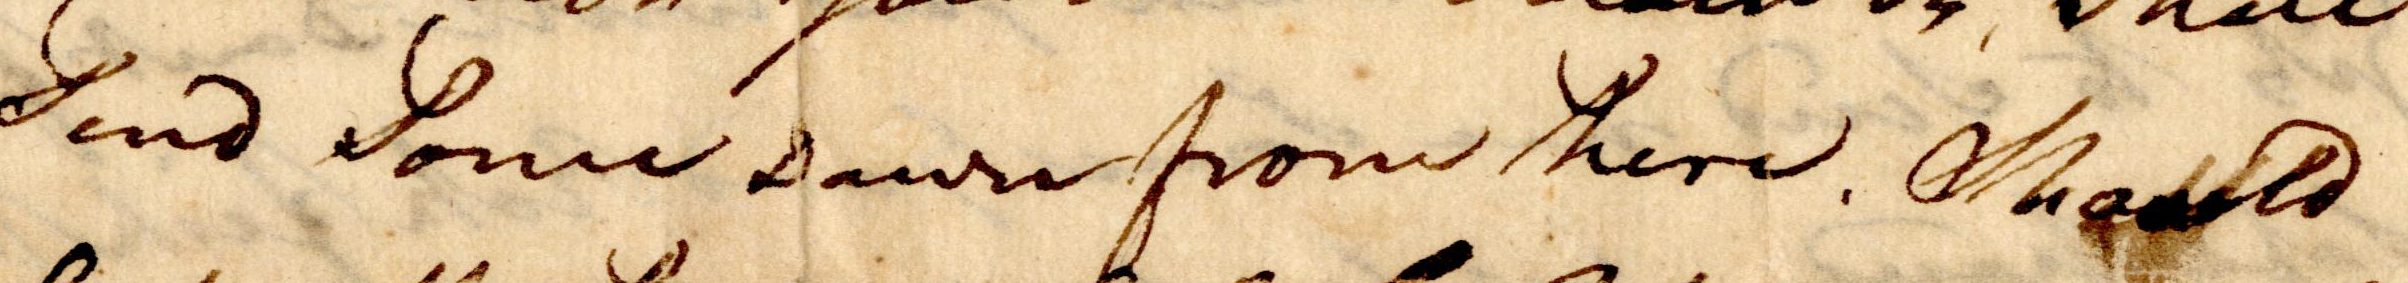send some Down from here, Should
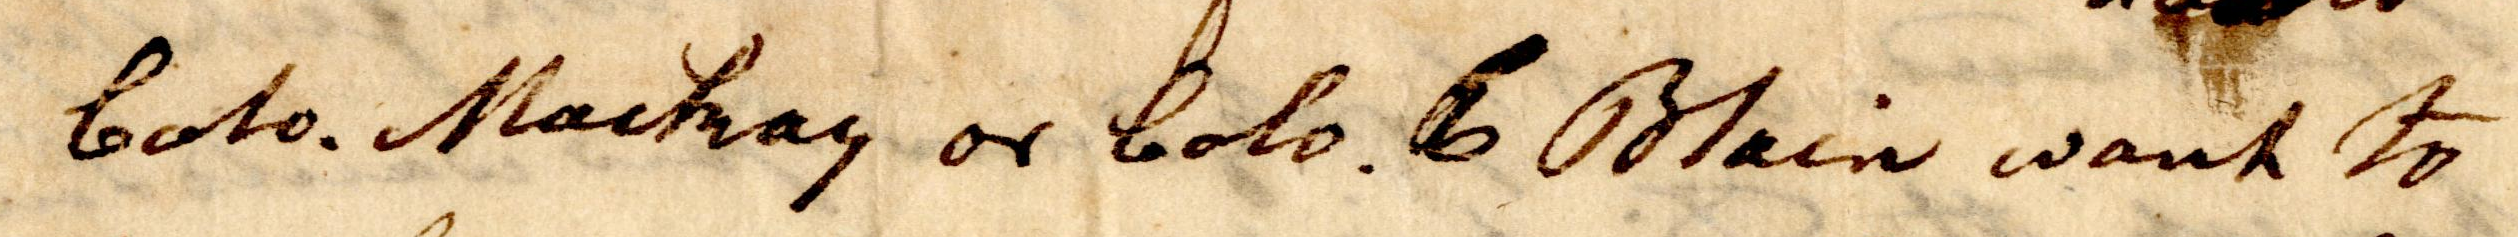Colo. Mackay or Colo. C Blain want to
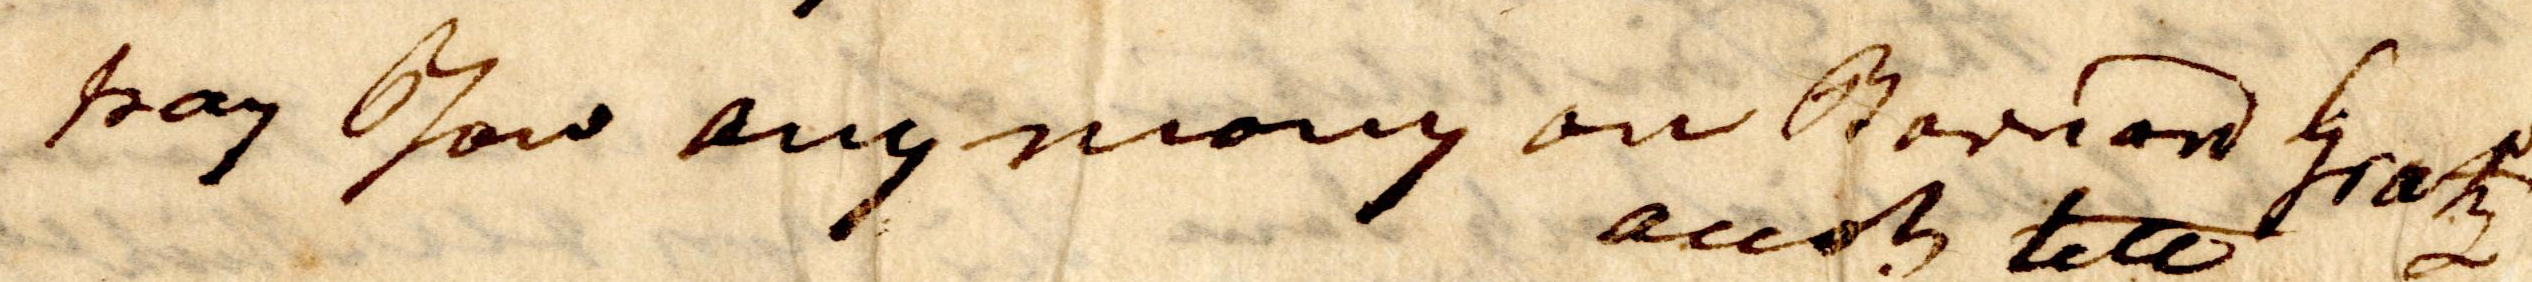pay you any money or Barnard Gratz
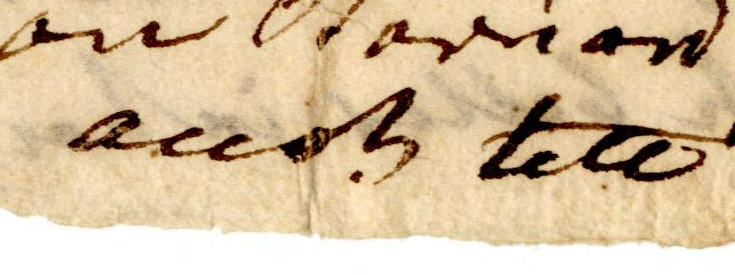acco^t tell
